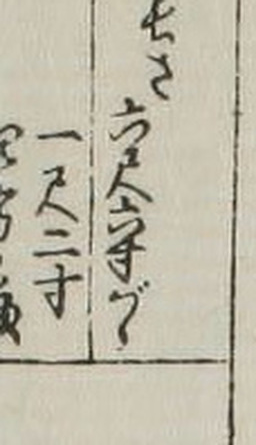六尺六寸づゝ
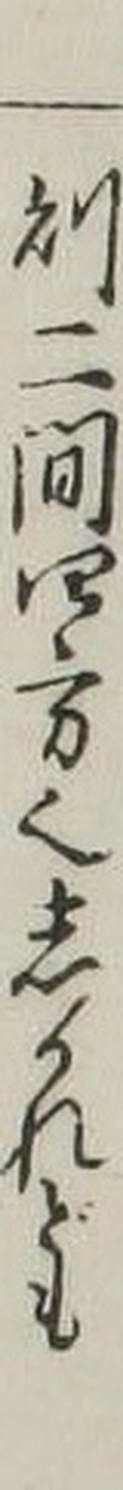則二間四方也しかれども
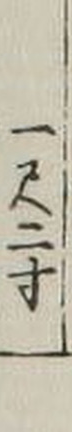一尺二寸
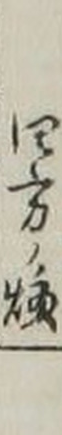四方ノ爐
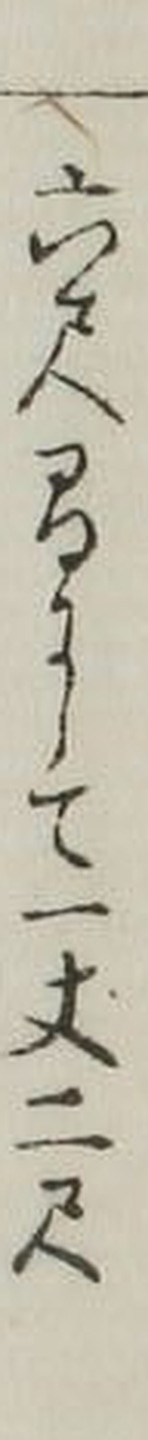六尺間にして一丈二尺
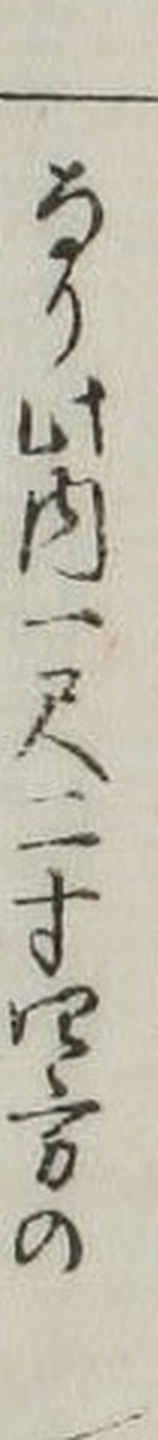なり此内一尺二寸四方の
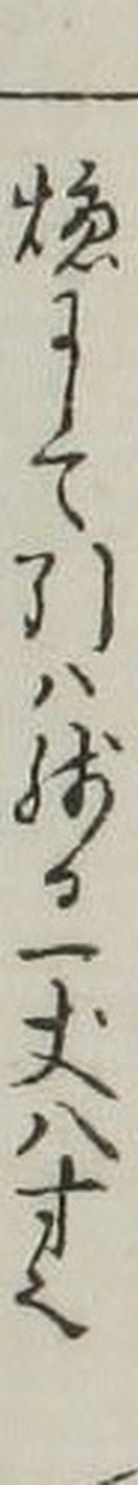爐にして引は残る一丈八寸也
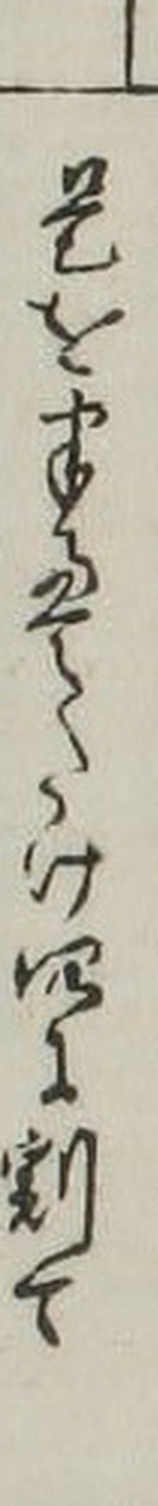是を半畳たけ四に割て
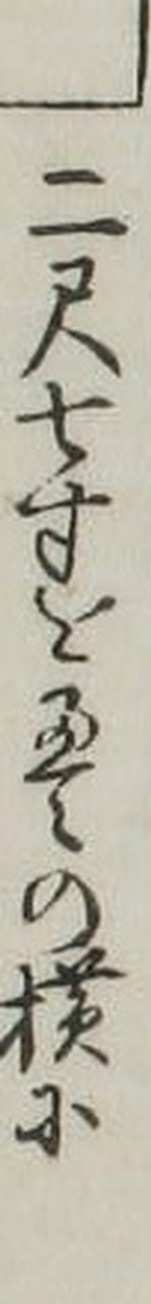二尺七寸を畳の横に
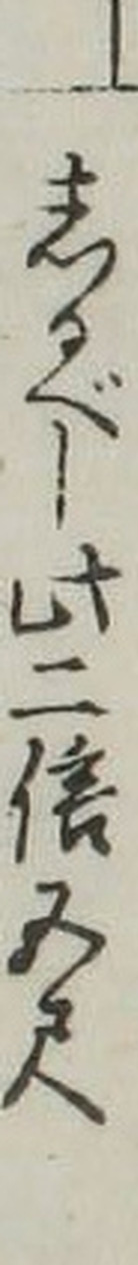しるべし此二倍五尺
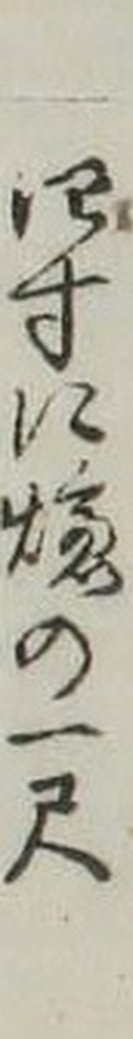四寸に爐の一尺
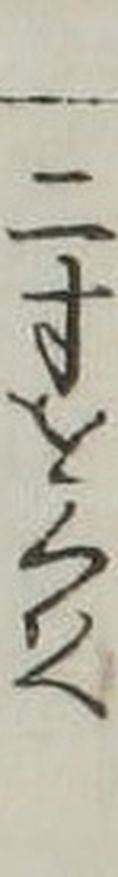二寸をくはへ
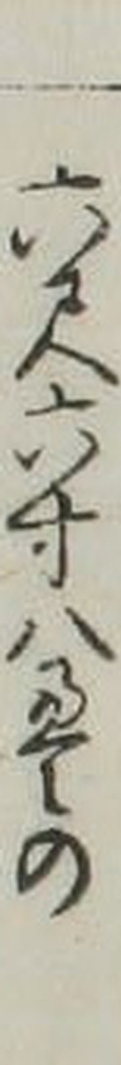六尺六寸八畳の
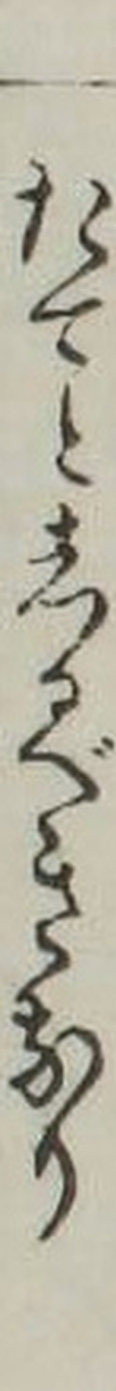たてとしるべきなり

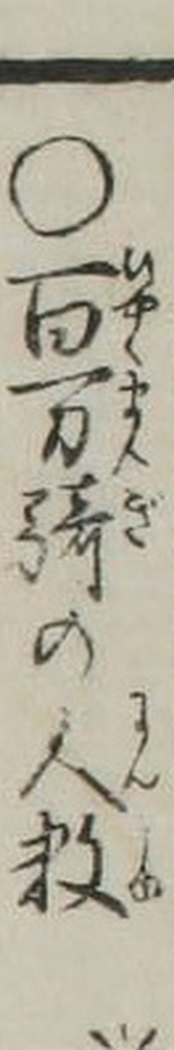○百万騎の人数
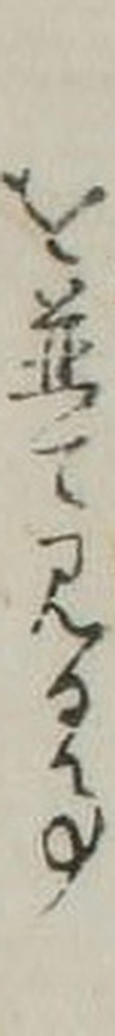を並て見る事
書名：宝玉塵劫記
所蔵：東京学芸大学教育コンテンツアーカイブ
